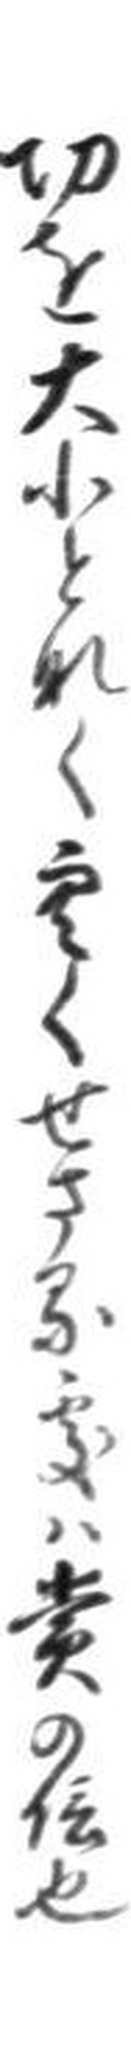功を大小となく空くせさる処は賞の信也
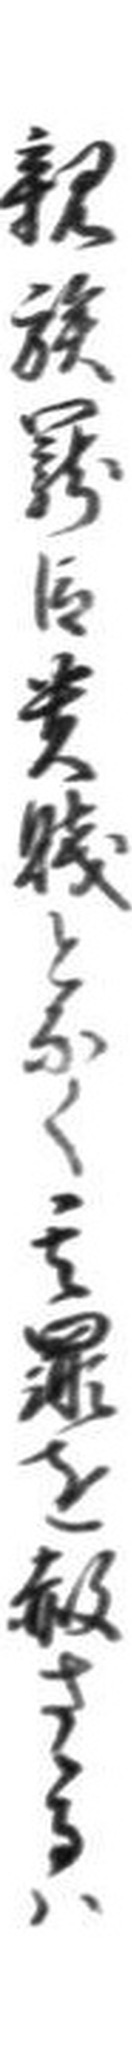親族寵臣貴賤となく其罪を赦さゝるは

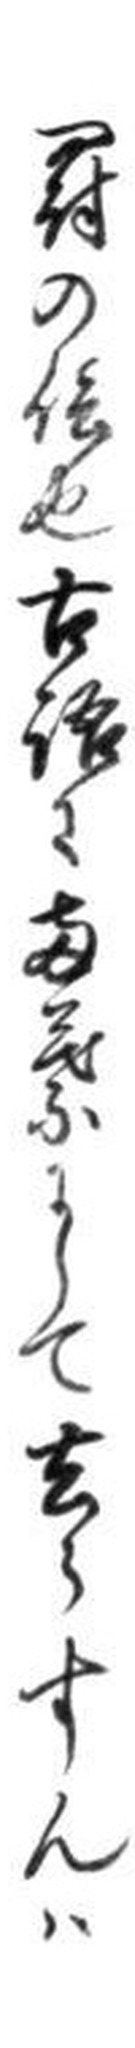罰の信也古語に両葉にして去らすんは
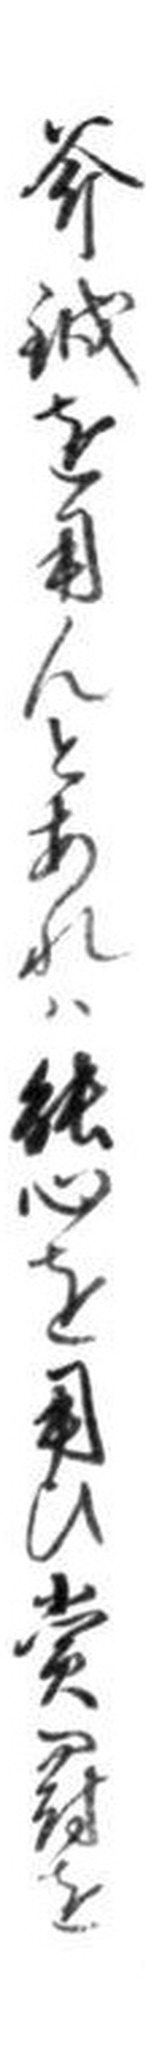斧鉞を用んとあれは能心を用ひ賞罰を
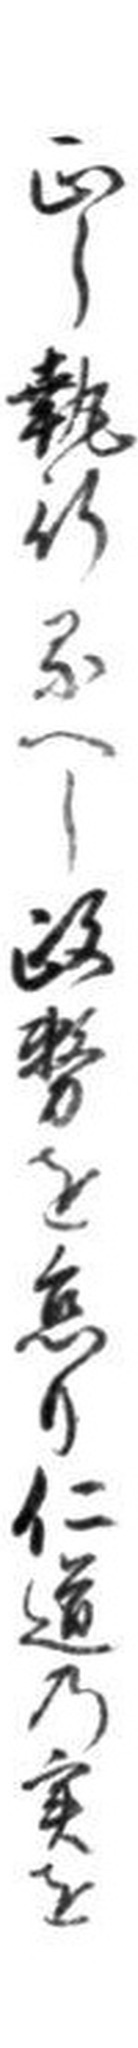正し執行るへし政務を怠り仁道の実を
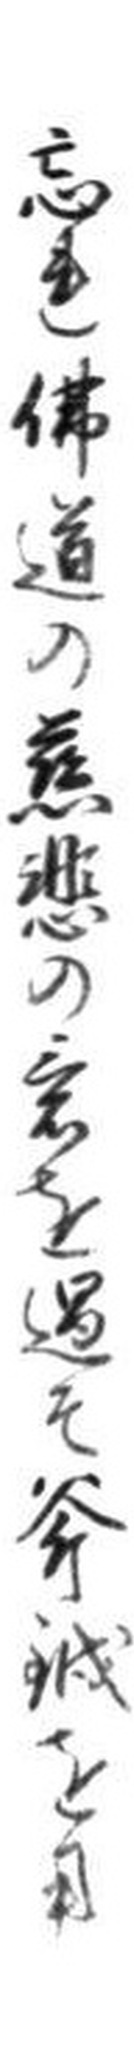忘れ仏道の慈悲の意を遏そ斧鉞を用
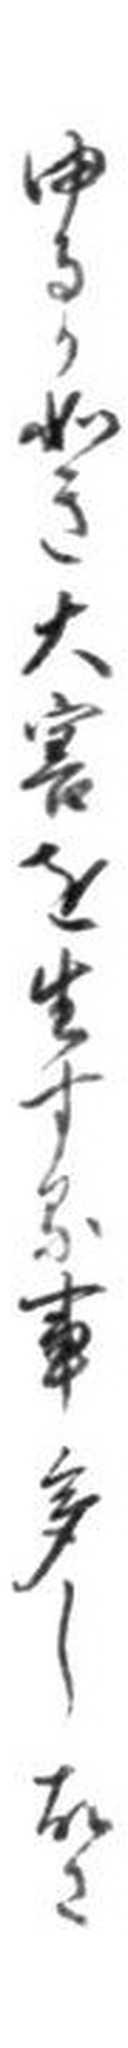ゆるか如き大害を生する事多し故に
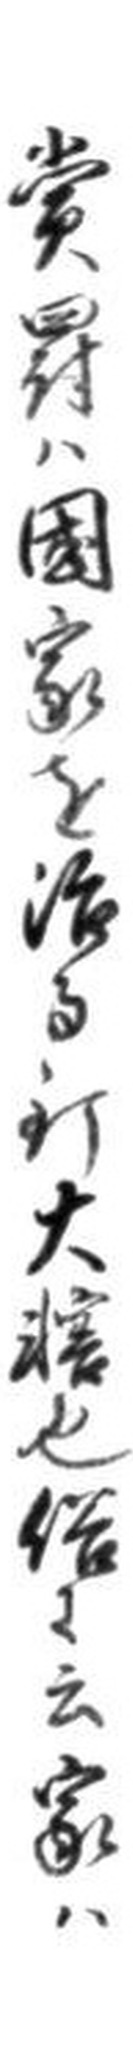賞罰は国家を治る釘大轄也俗に云家は
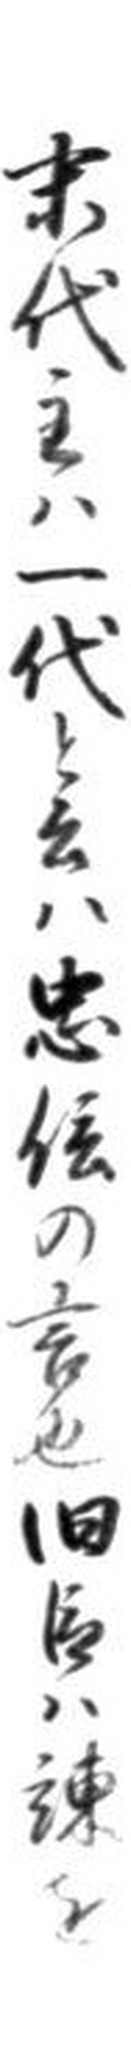末代主は一代と云は忠信の言也旧臣は諫を
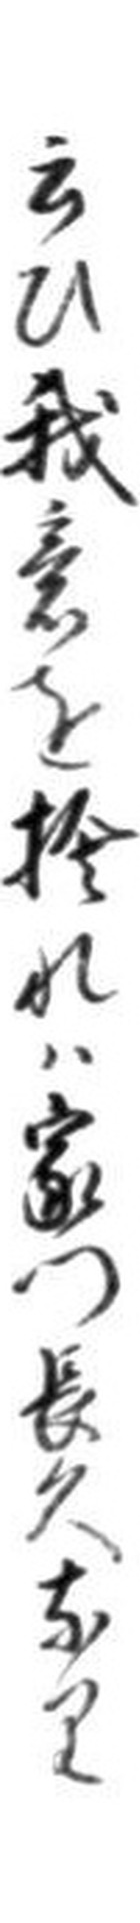云ひ我意を捨れは家門長久なり
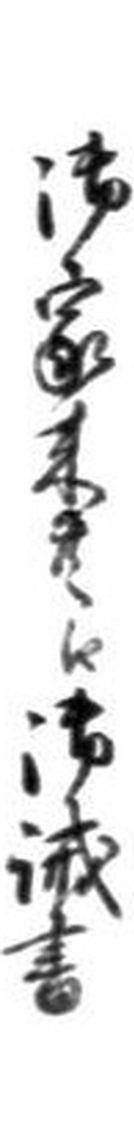御家来共江御誡書
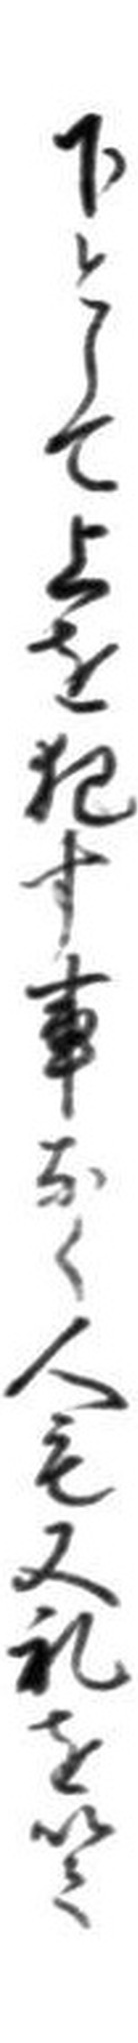下として上を犯す事なく人も又礼を以て
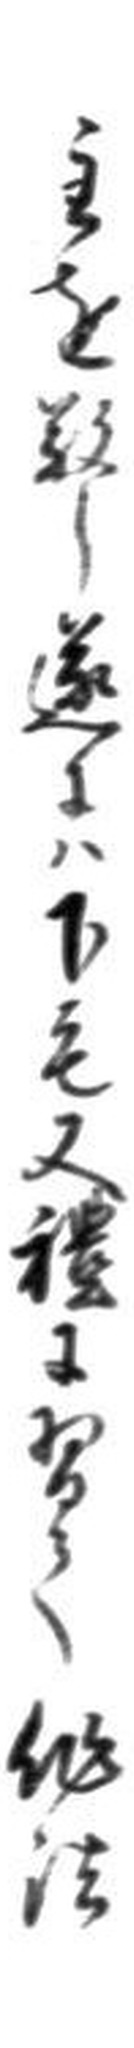主を敬し遂には下も又礼に習て作法
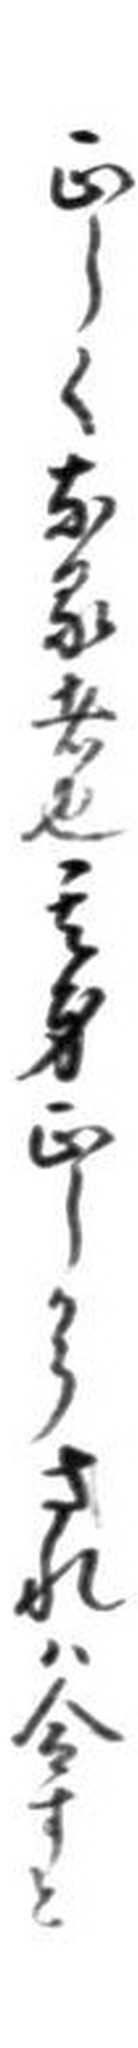正しくなる者也其身正しからされは合すと
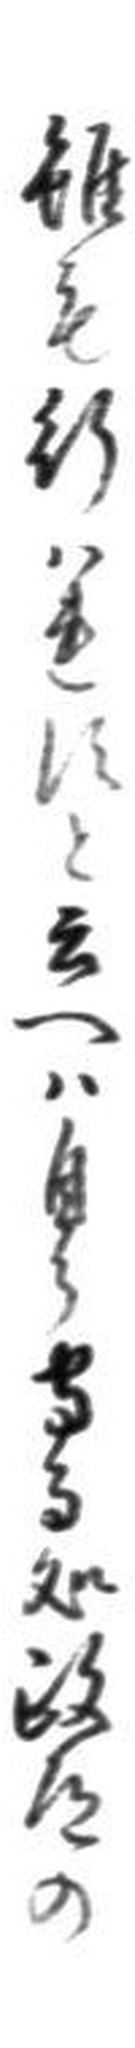雖も行はれすと云へは自ら守る処政道の
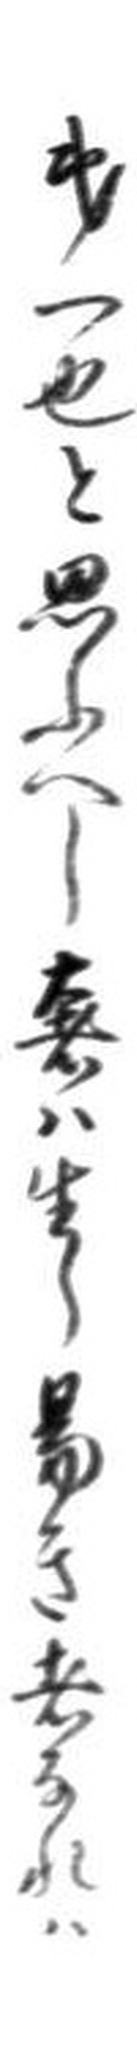第一也と思ふへし奢は生し易き者なれは
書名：家譜 一 秀康公 従天正二年到慶長十二年
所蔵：福井県文書館 Fukui Prefectural Archives
